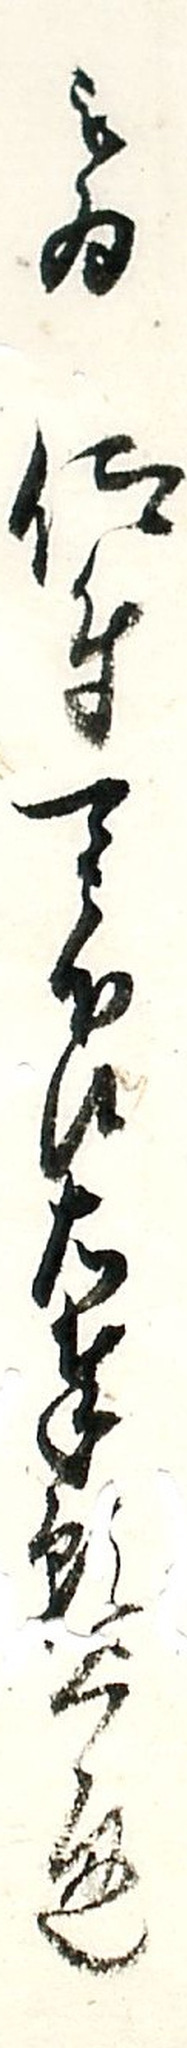被為仰付可被下候右奉願上候通
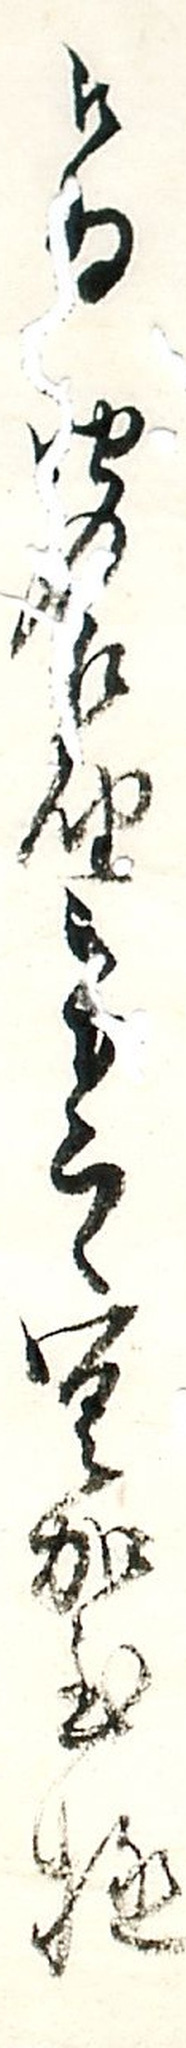被為聞被届被下候はゝ冥加至極
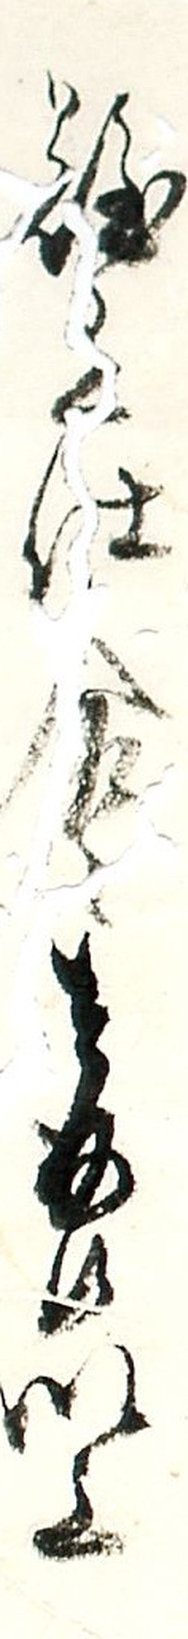難有仕合に奉存候以上
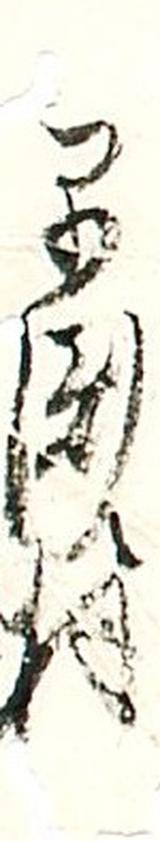早渕村
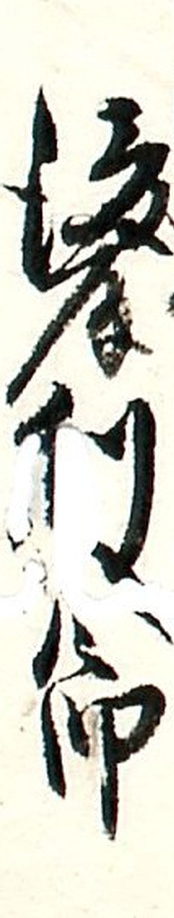後藤利八郎
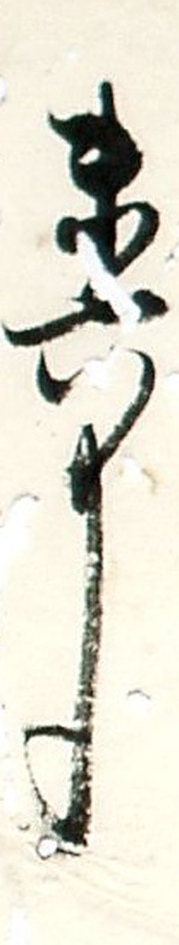未六月
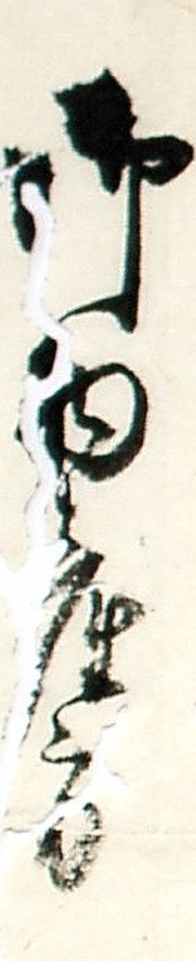御物産方
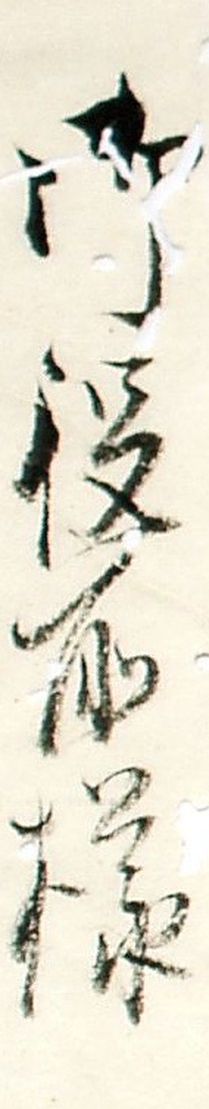御役所様
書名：乍恐横切ヲ以奉申上覚（山城谷漆買入銀一件ニ付）
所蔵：鳴門教育大学 Naruto University of Education
